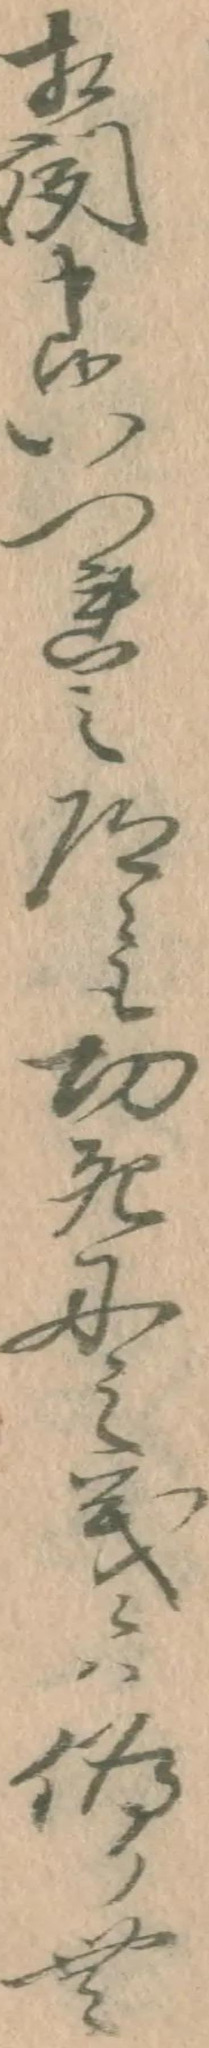相聞申候いつ連之道にも切死丹之義には偽り無
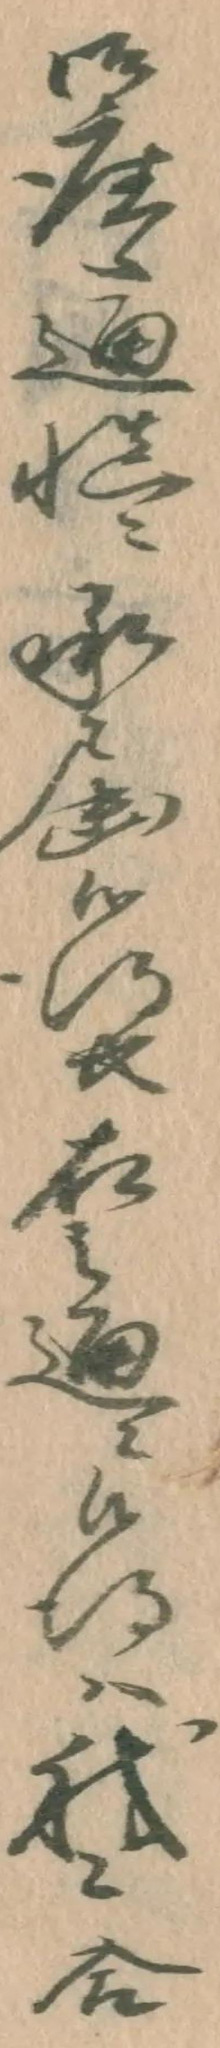御座候通慥に承届候得共右之通に候得は我々合
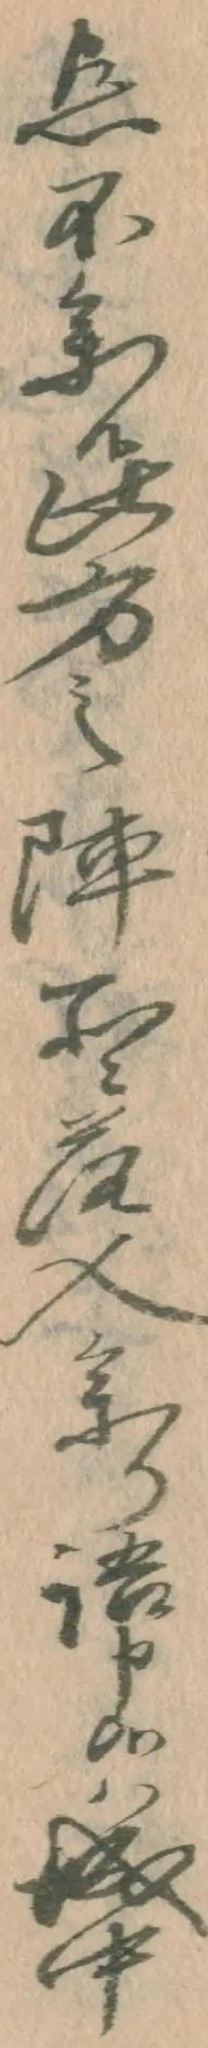点不参候此方之陣所に落入参り語申候は城中
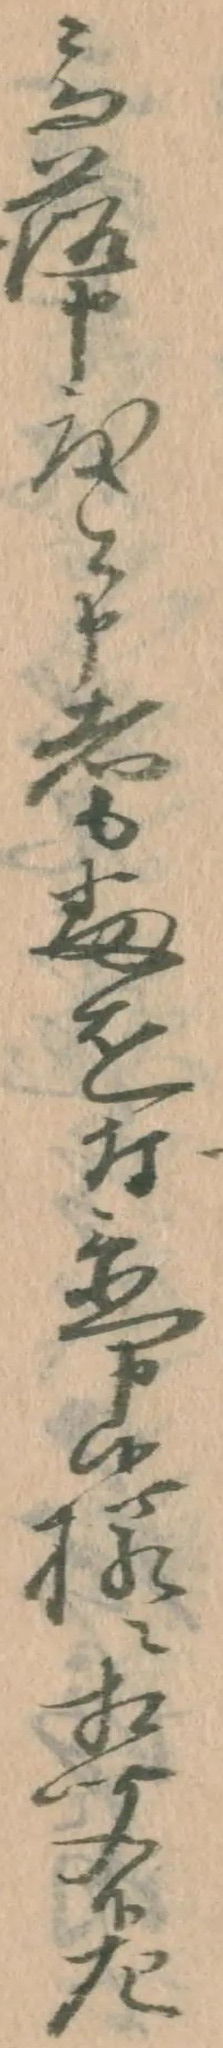に而落申度と申者も番を付置申候様に相聞候左
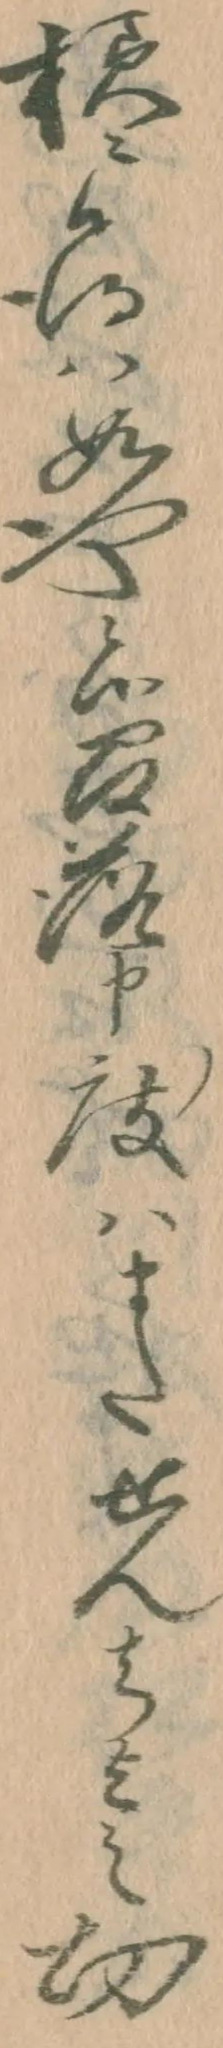様に候得は如何に候間落申度はまたせんち与之切
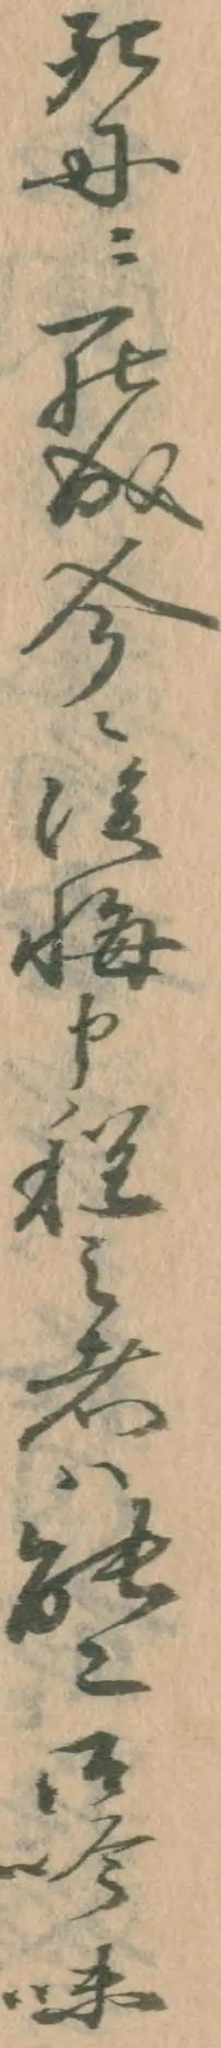死丹に罷成今に後悔申程之者は能々御吟味
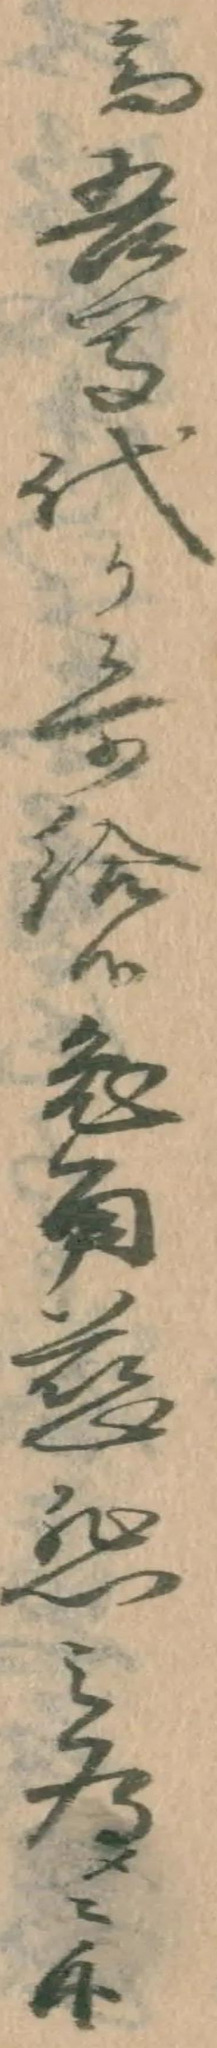に而吾等代りに可給候兎角慈悲之為に候
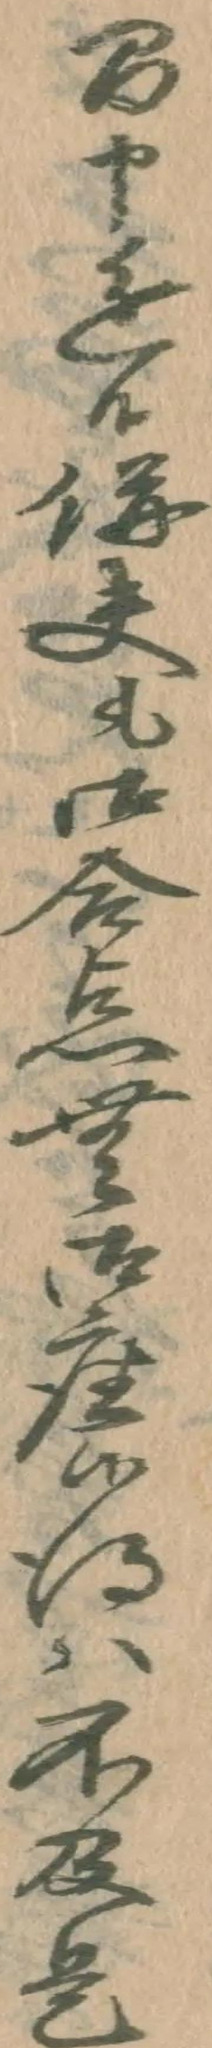間申懸候併夫も御合点無御座候得は不及是
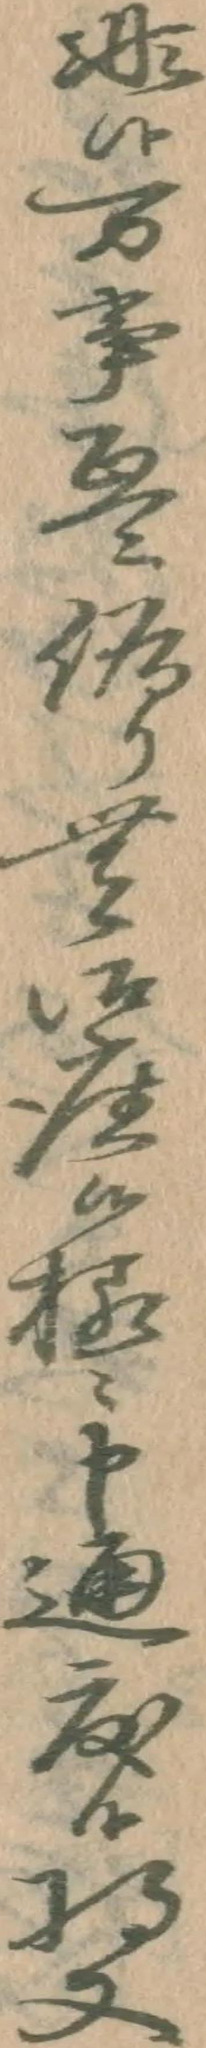非候万事互に偽り無御座候様に申通度候将又
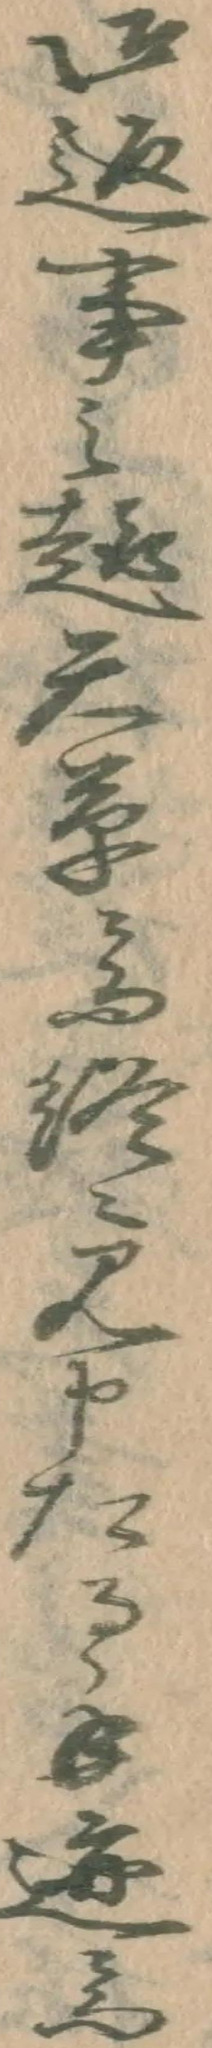御返事之趣天草に而終に見申たる手迹に而
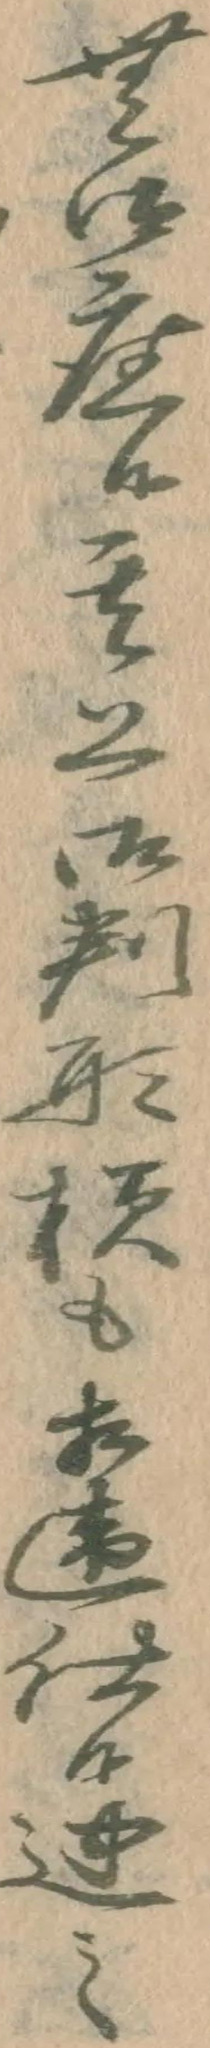無御座候其上御判形様も相違仕候迚之
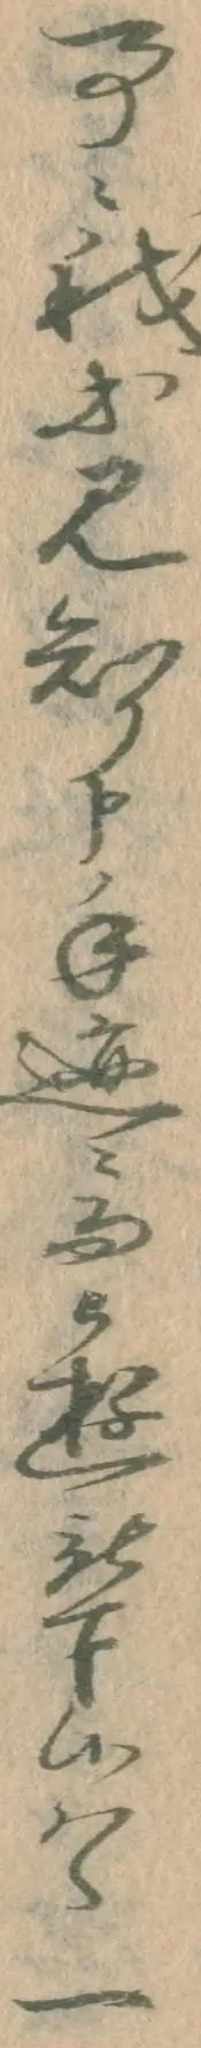事に我等見知り申手迹に而被遊下候はゝ一
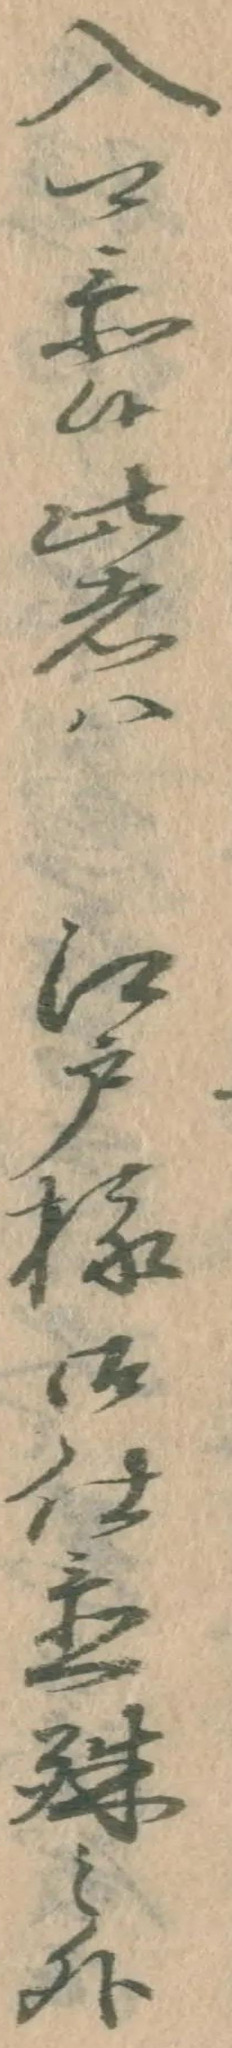入可忝候此者は江戸様御仕置殊之外
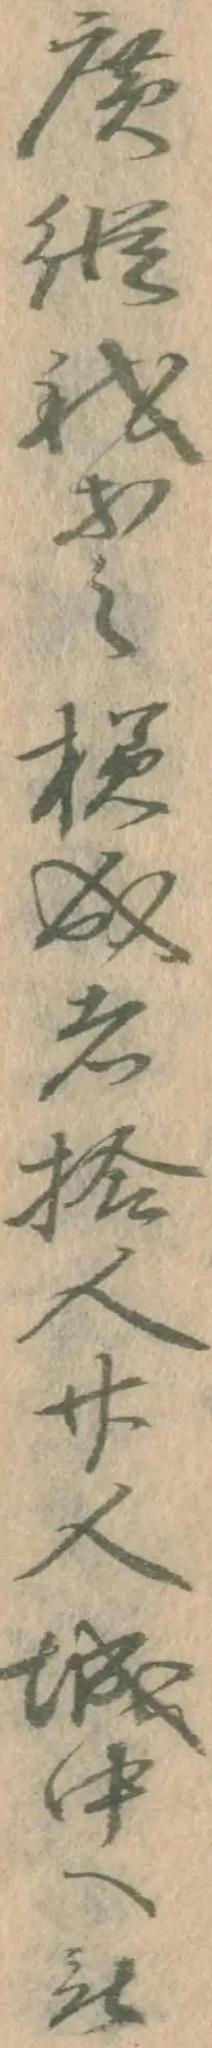広縦我等之様成者拾人廿人城中へ被
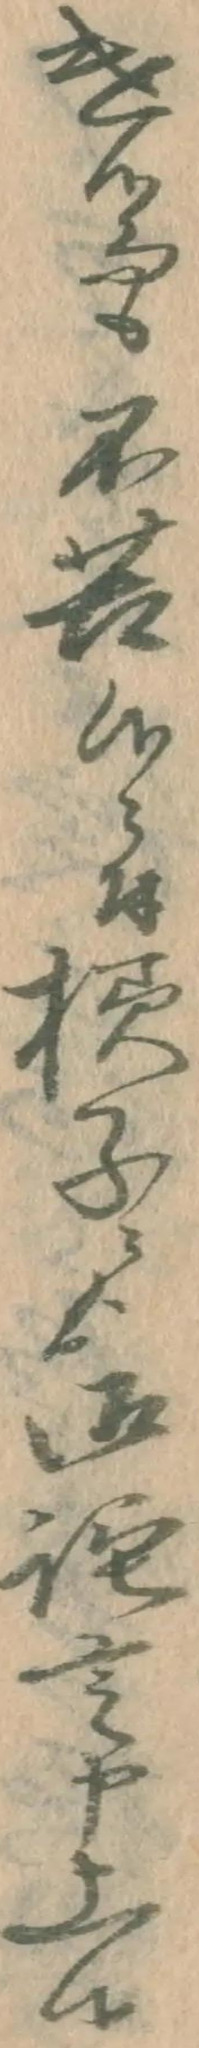遣候而も不苦候に付様子にゟ御詫言申上候

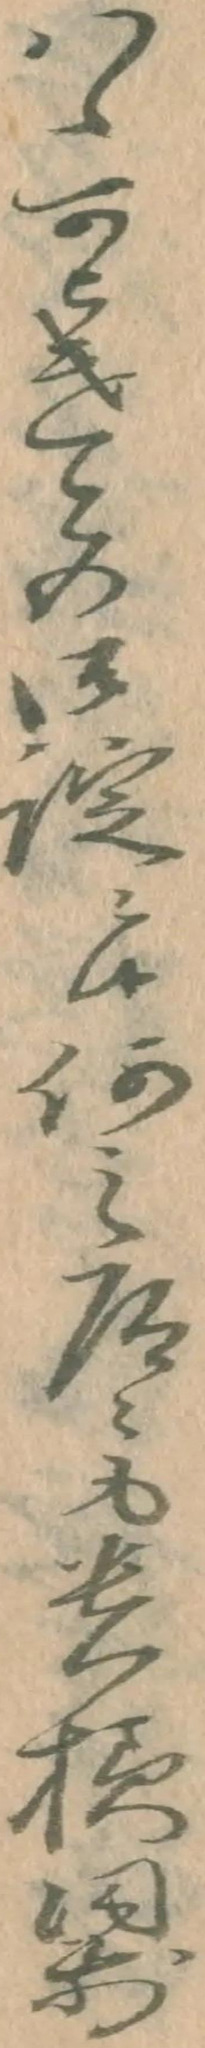はゝ可被遣との御諚に候何之道にも貴様同前
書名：切支丹御退治記 49巻. [6]
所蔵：国立国会図書館 National Diet Library, JAPAN
